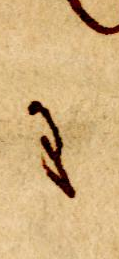in
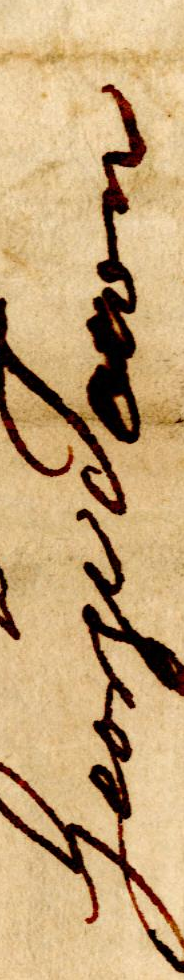Georgetown
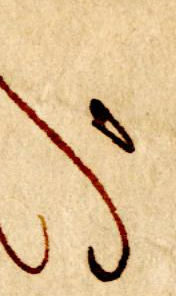To
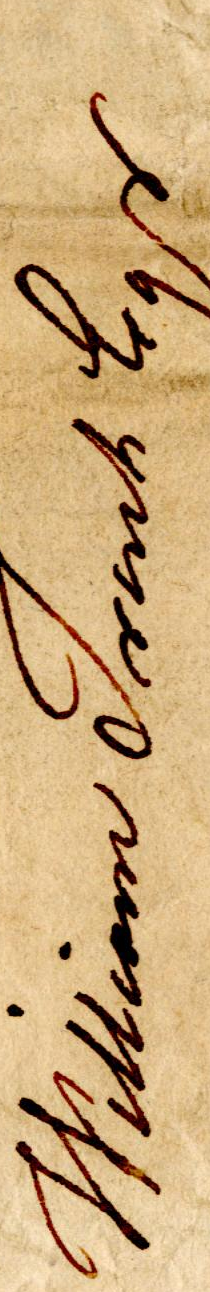William Frank Esq^r
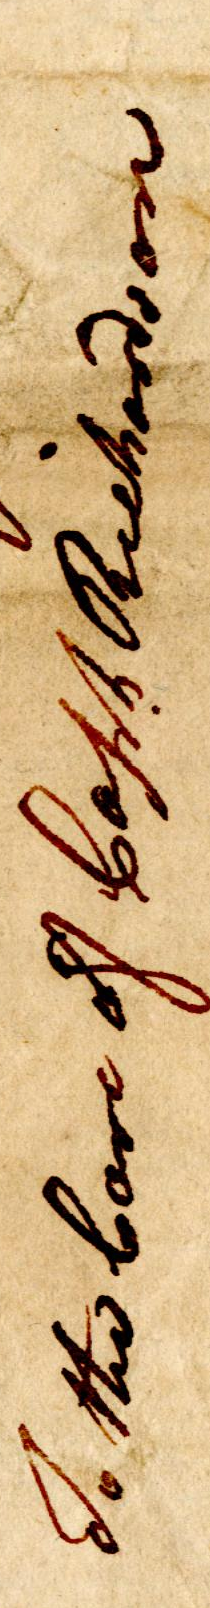To the care of Capt^n Richardson
